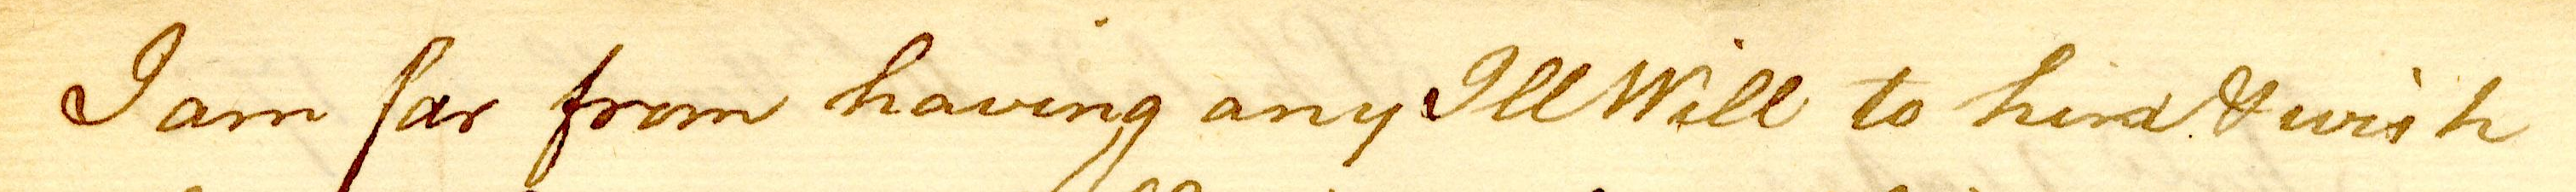I am far from having any Ill Will to him & wish
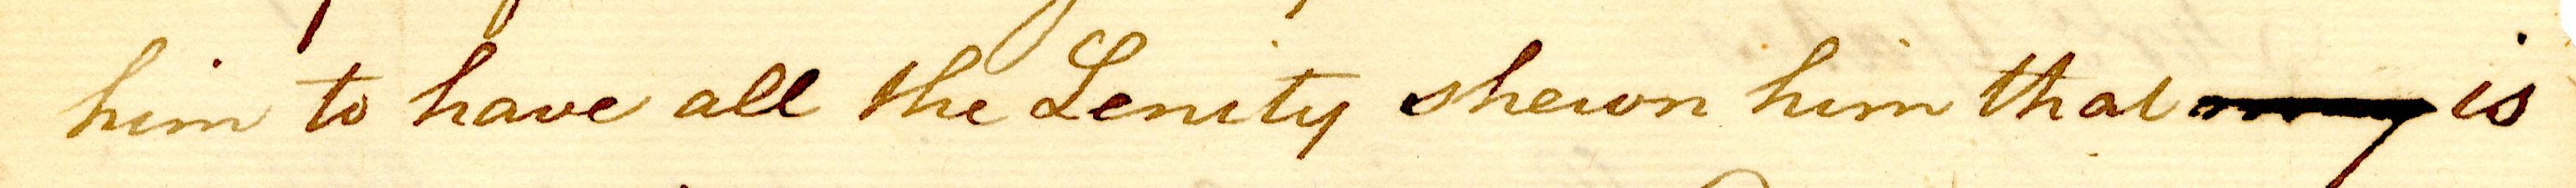him to have all the Lenity shewn him that [__] is
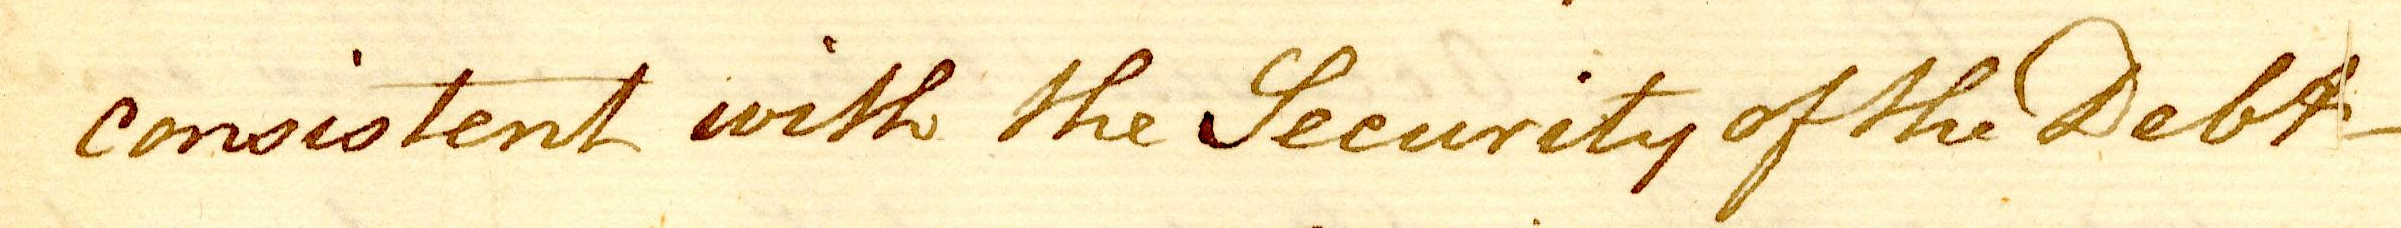consistent with the Security of the Debt.
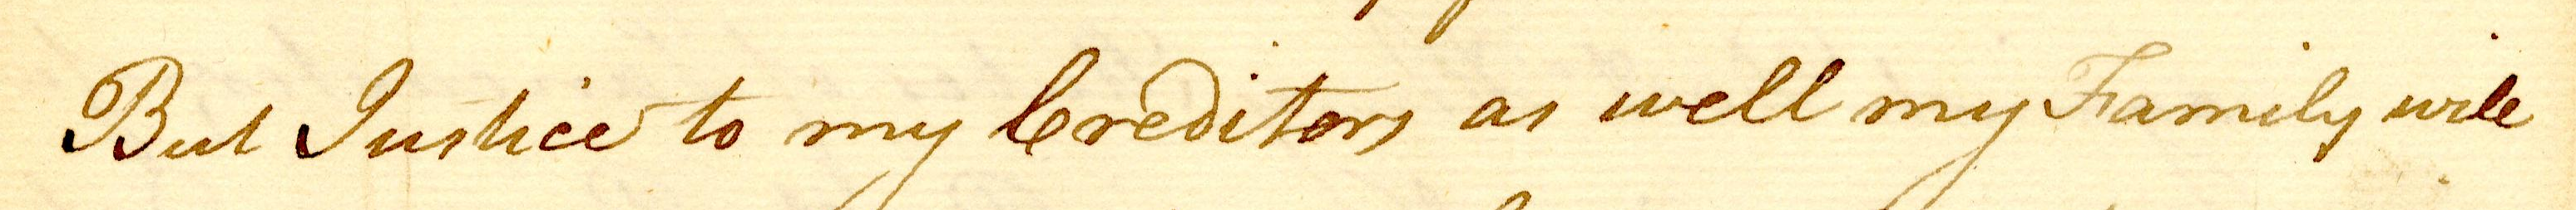But Justice to my Creditors as well my Family will
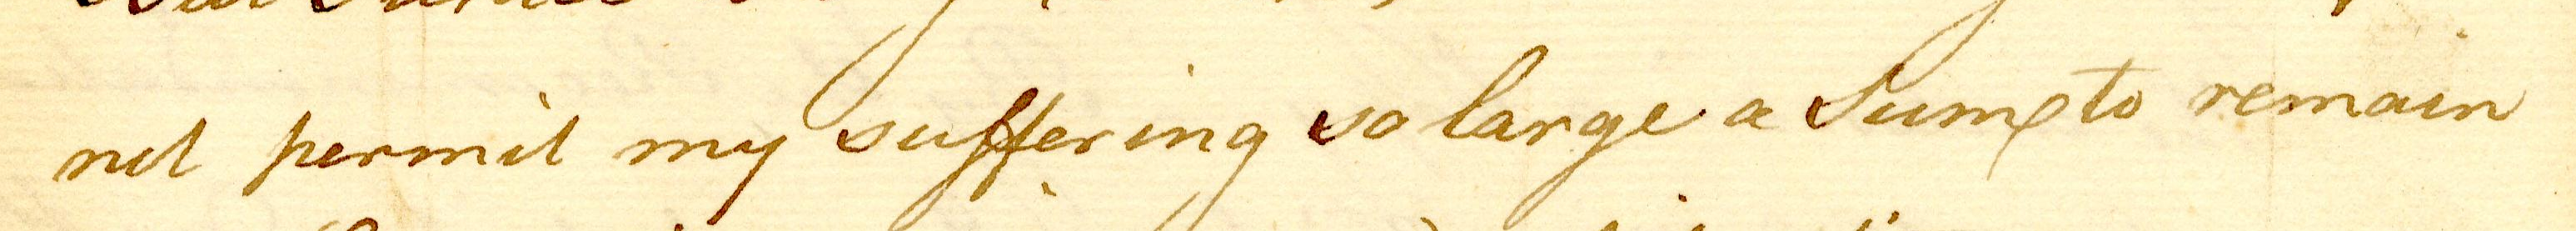not permit my suffering so large a Sum to remain
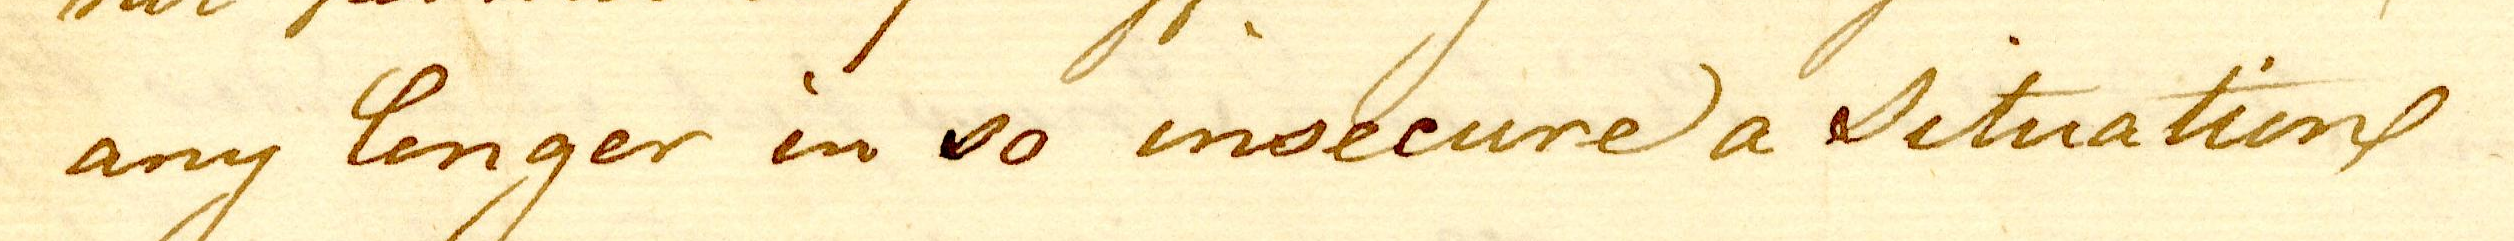any longer in so insecure a Situation
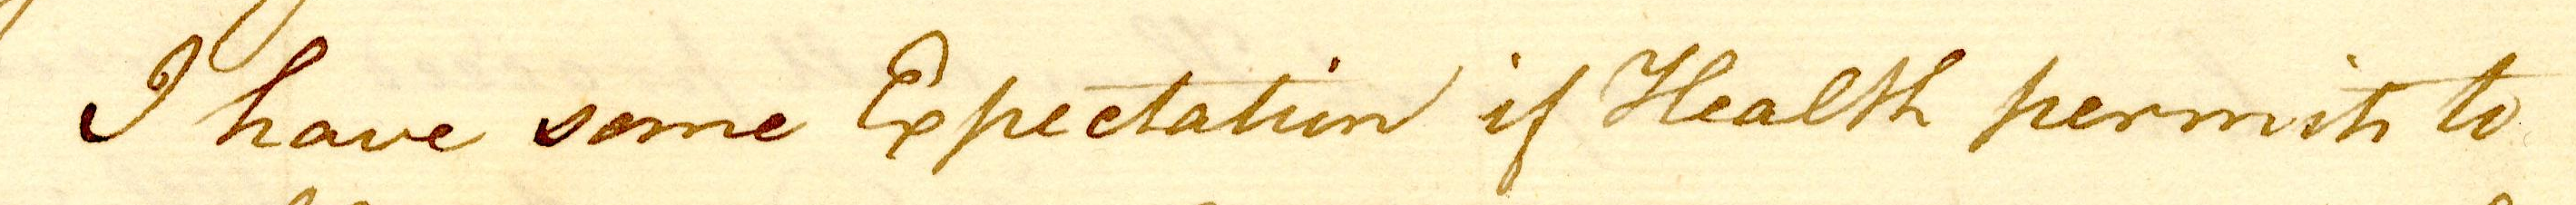I have some Expectation if Health permits to
